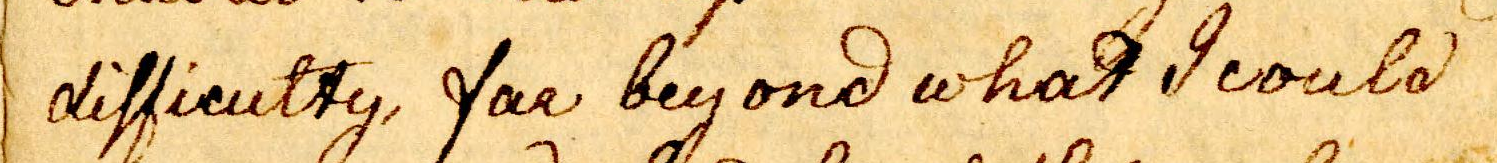difficulty, far beyond what I could
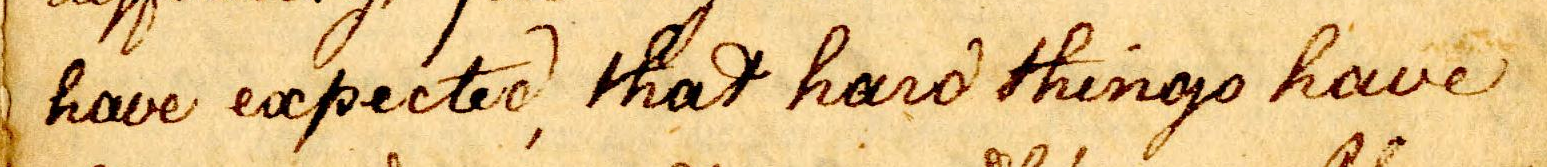have expected that hard things have
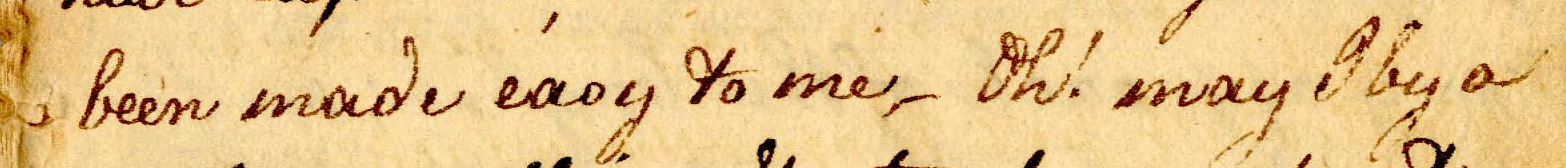-been made easy to me- Oh! may I by a
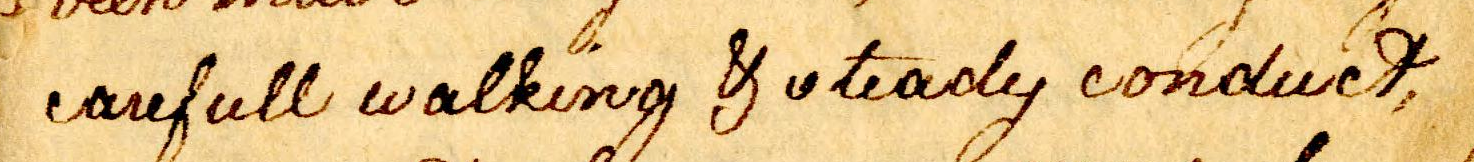carefull walking & steady conduct,
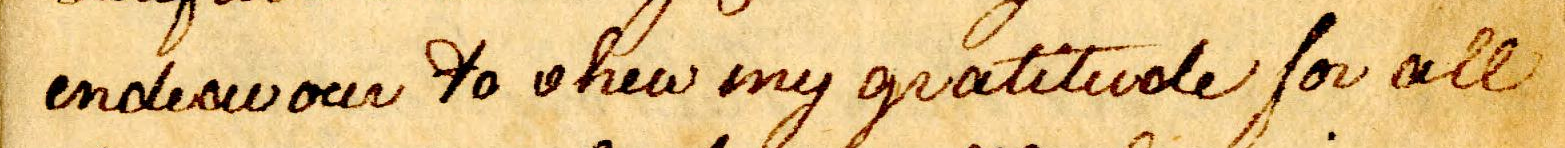endeavour to shew my gratitude for all
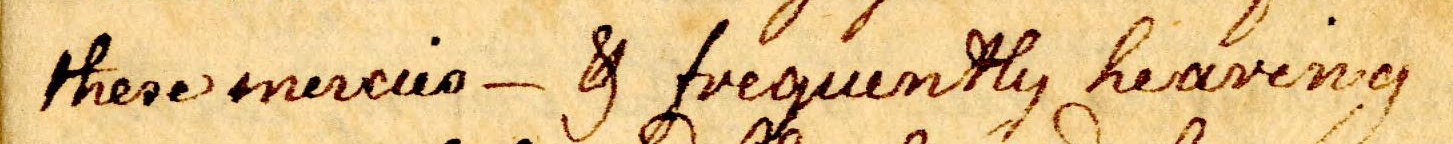there mercies- & frequently hearing
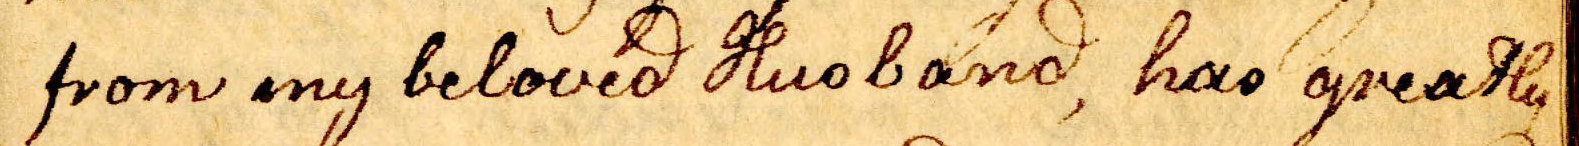from my beloved Husband, has greatly
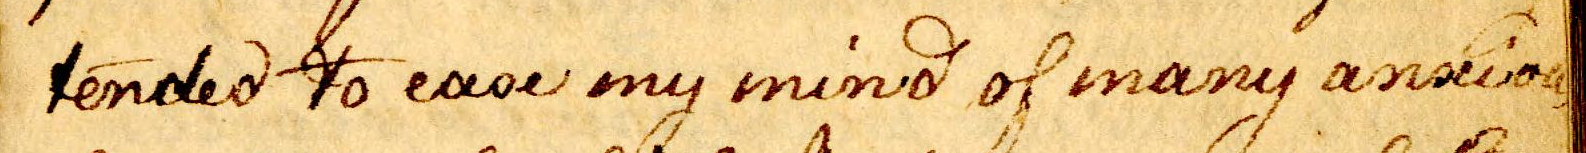tended to ease my mind of many anxiou
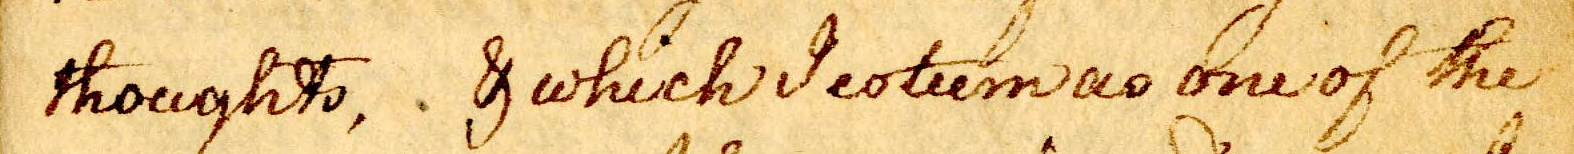thoughts, & which I esteem as one of the
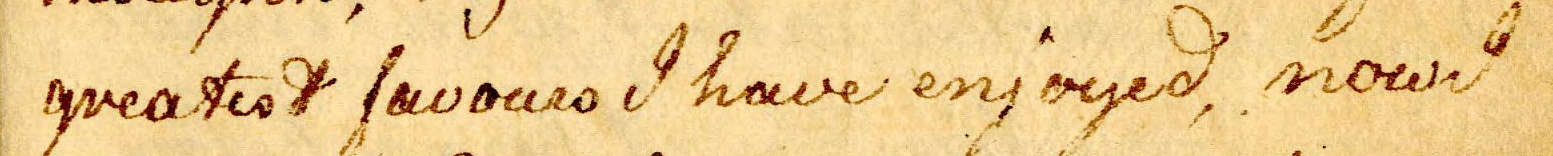greatest favours I have enjoyed, now[n]
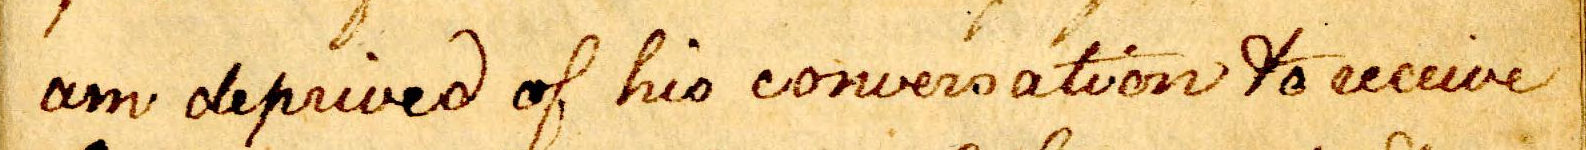am deprived of his conversation to receive
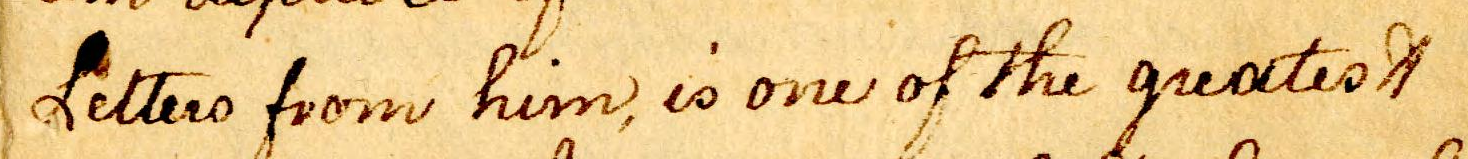Letters from him, is one of the greatest
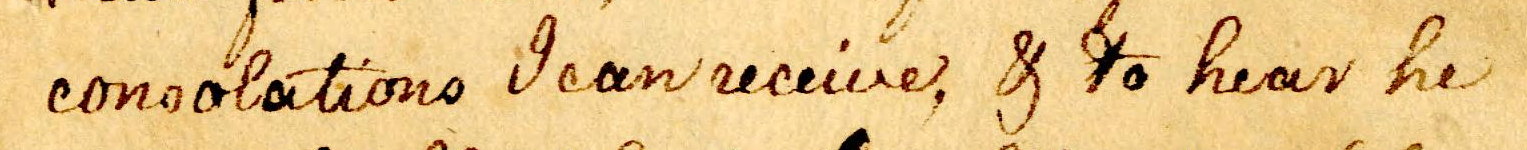consolations I can receive, & to hear he
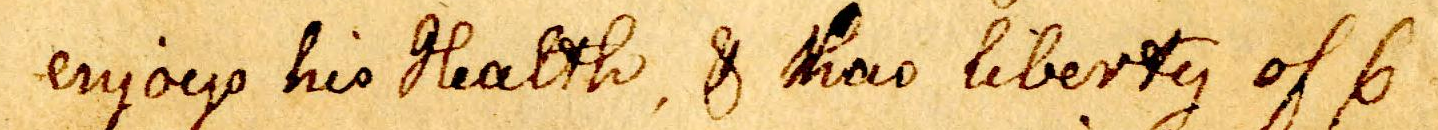enjoys his Health & has liberty of 6
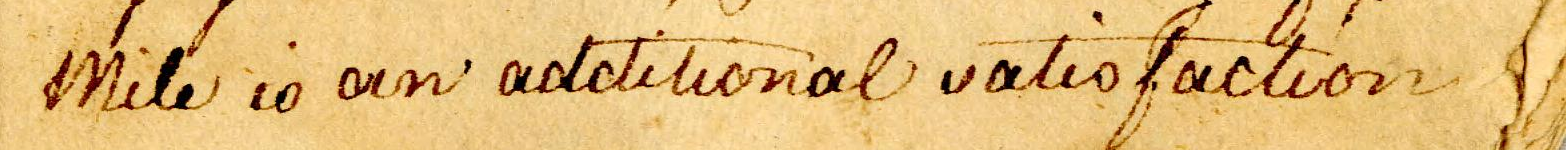Mile is an additional satisfaction
